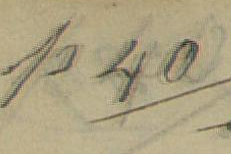p40
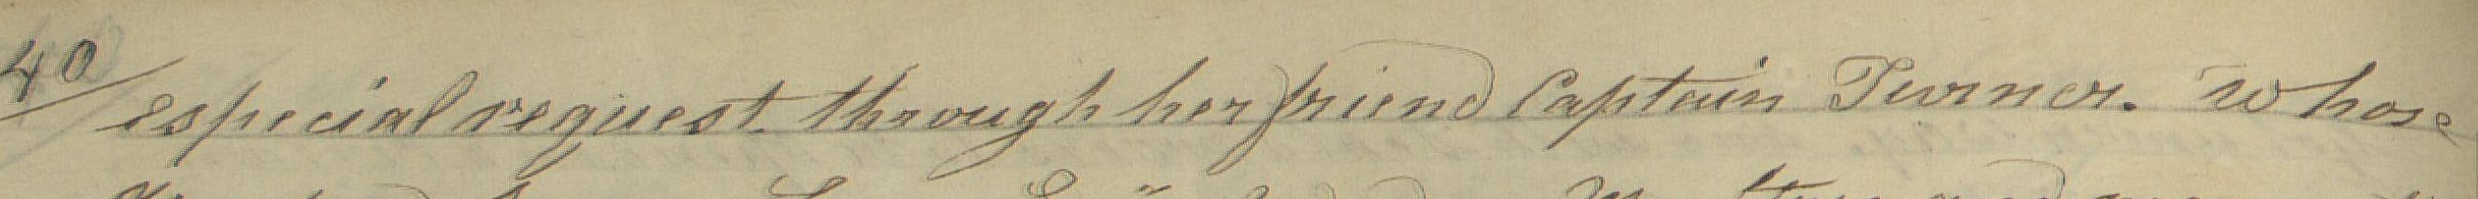especial request through her friend Captain Turner. whose
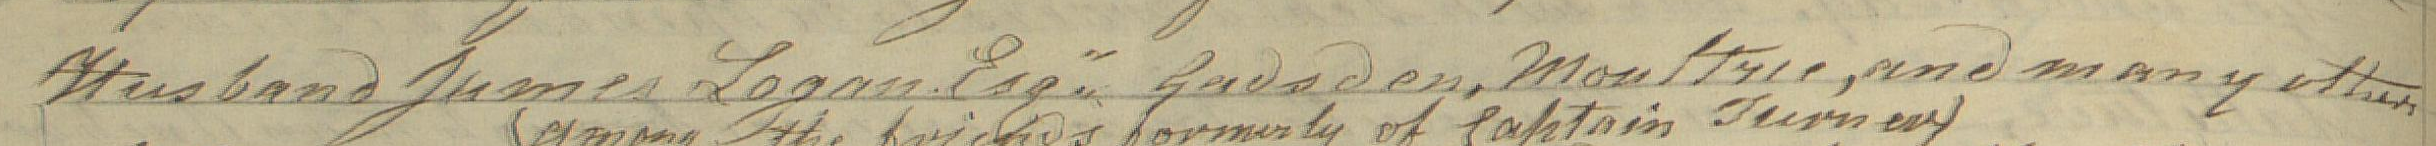Husband James Logan, Esq^r. Gadsden, Moultrec, and many other
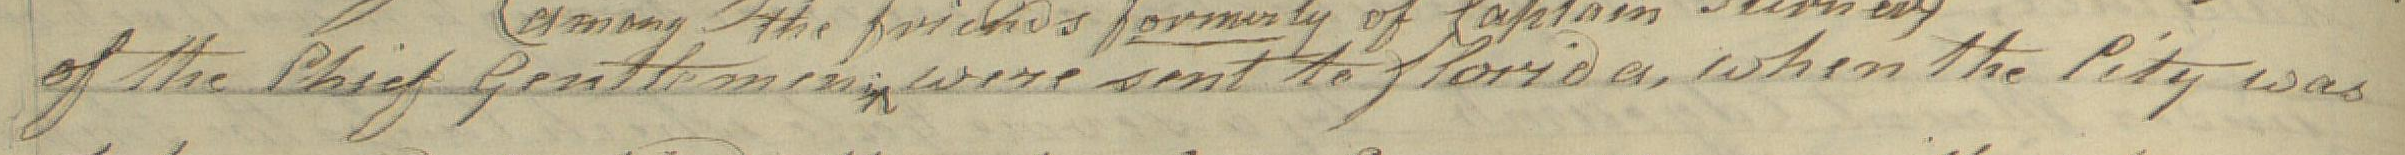of the Chief Gentlemen; ^ were sent to florida, when the City was
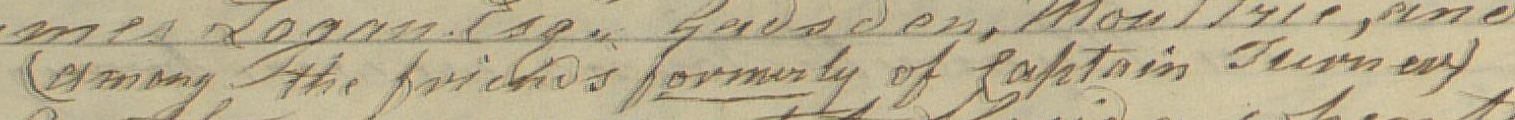(among the friends formerly of Captain Turnevy
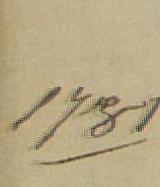1781
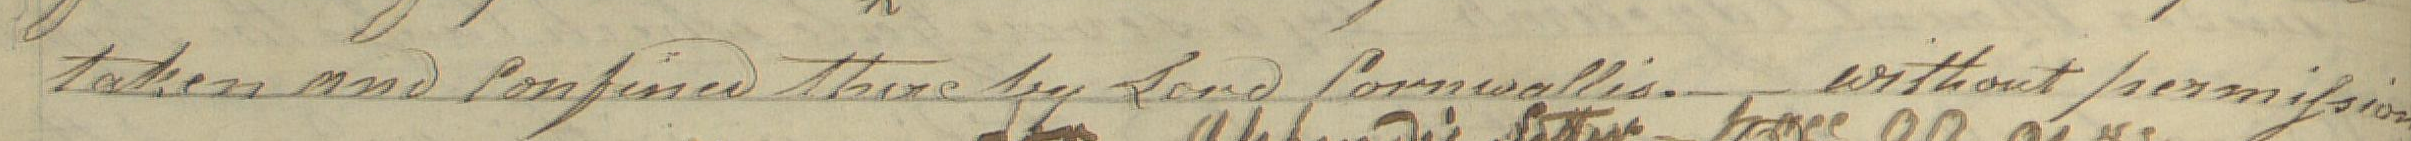taken and confined there by Lord Cornwallis.-- without permission
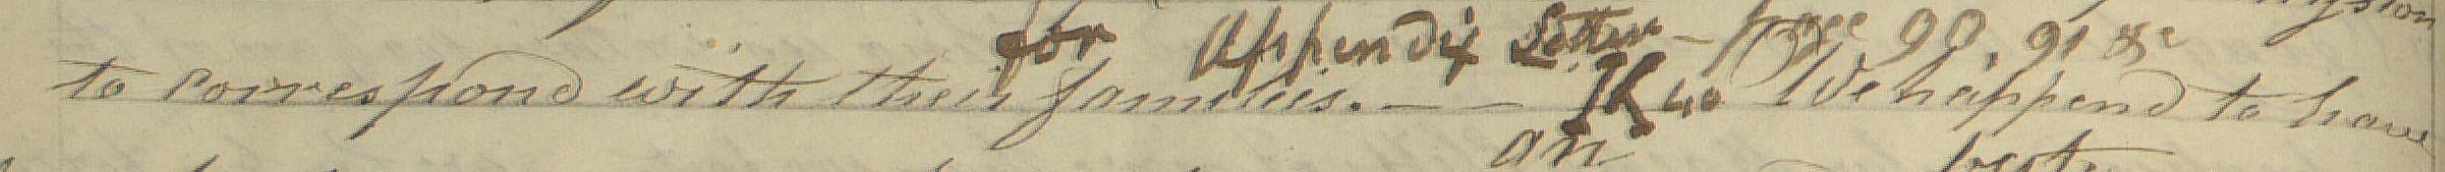to correspond with their families. K40 We happend to have
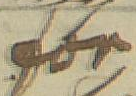for
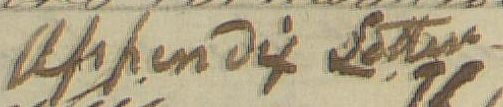Appendix Letters
